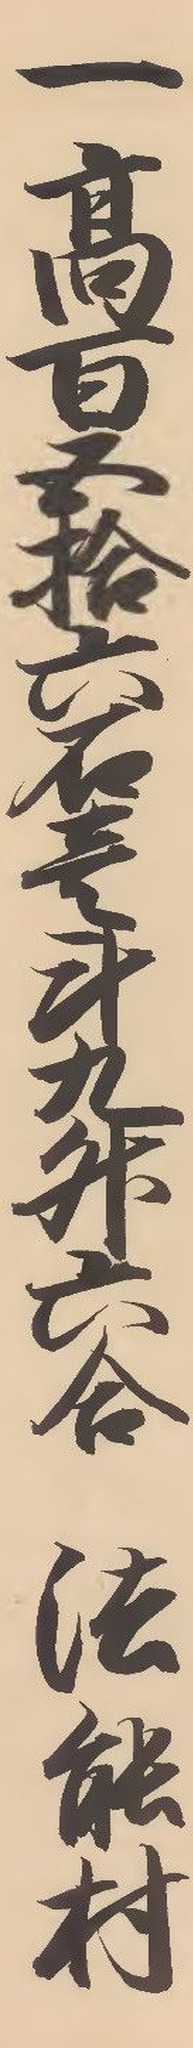一高百五拾六石壱斗九升六合法能村
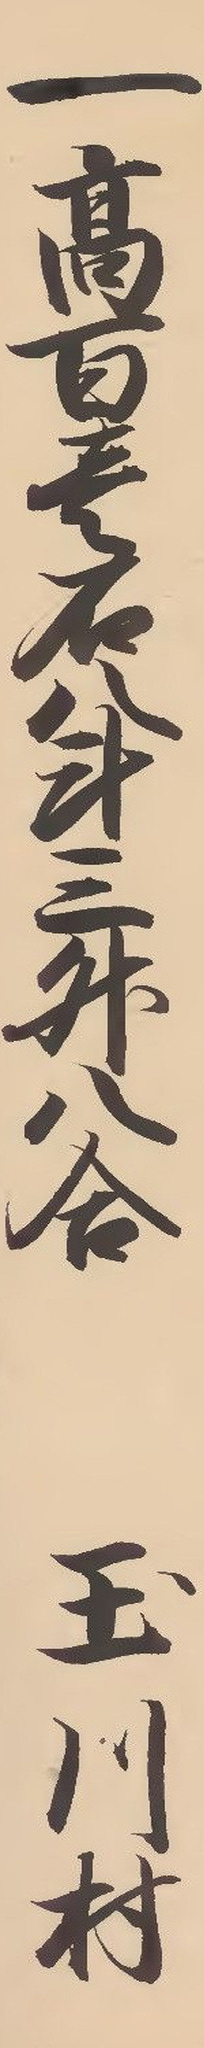一高百壱石八斗三升八合玉川村
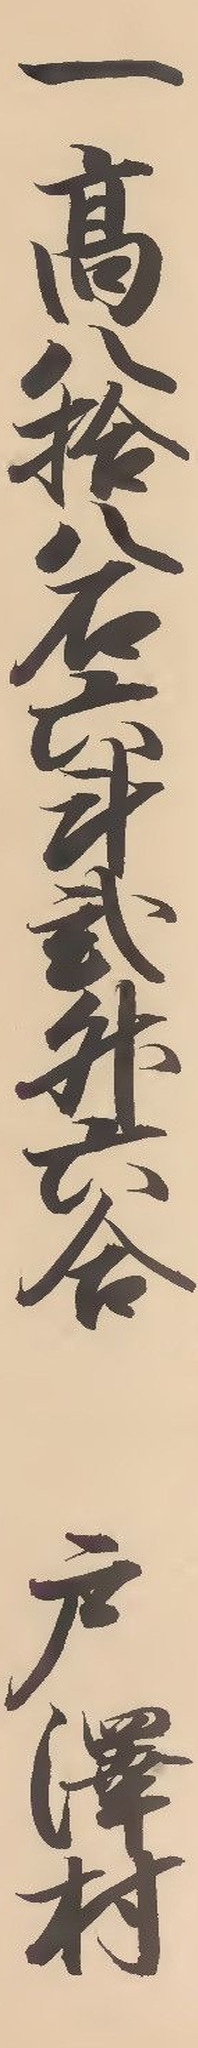一高八拾八石六斗弐升六合戸沢村
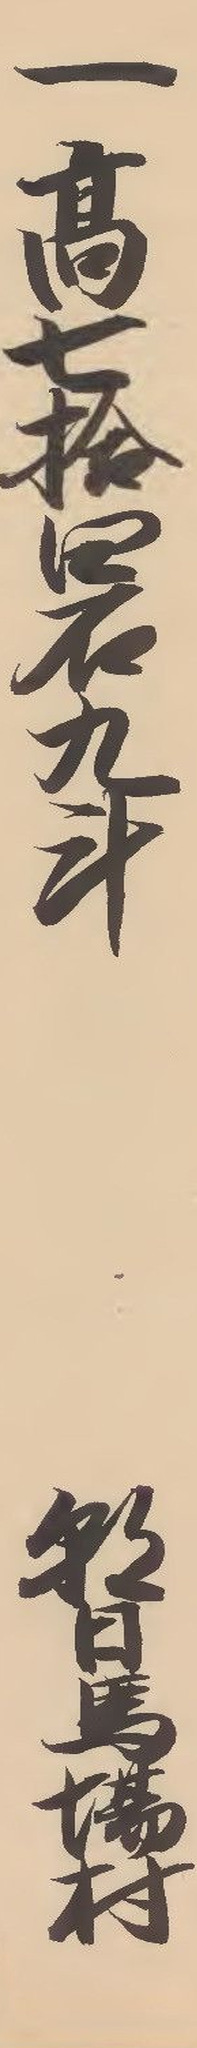一高七拾四石九斗朝日馬場村
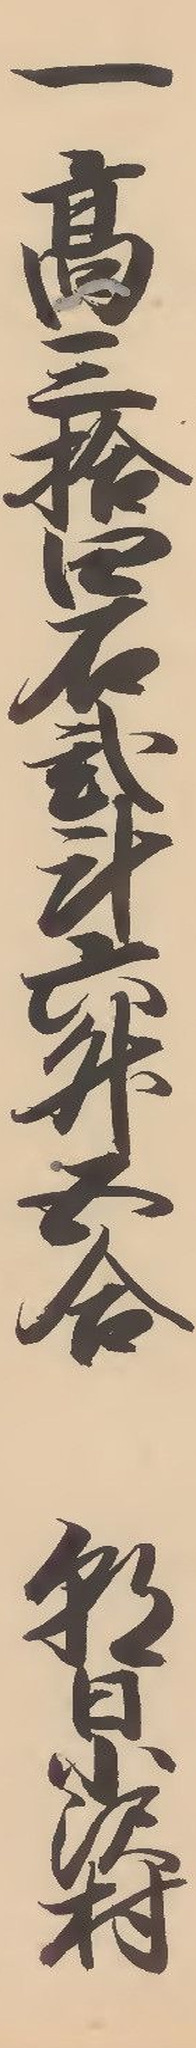一高三拾四石弐斗六升五合朝日小沢村

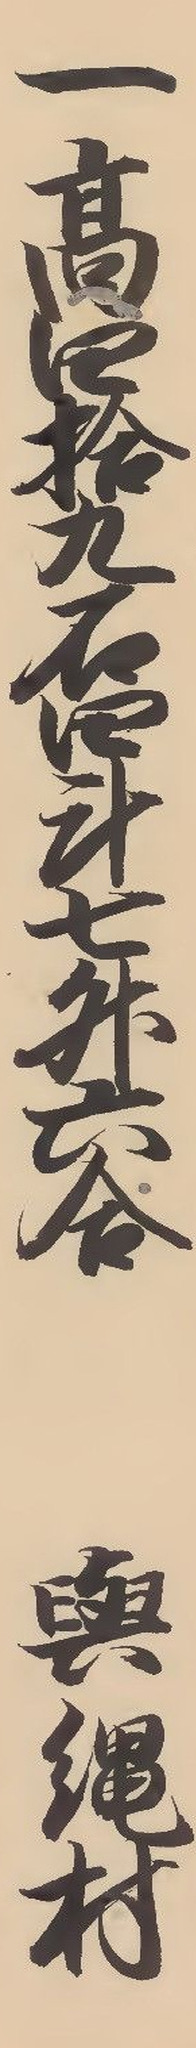一高四拾九石四斗七升六合与縄村
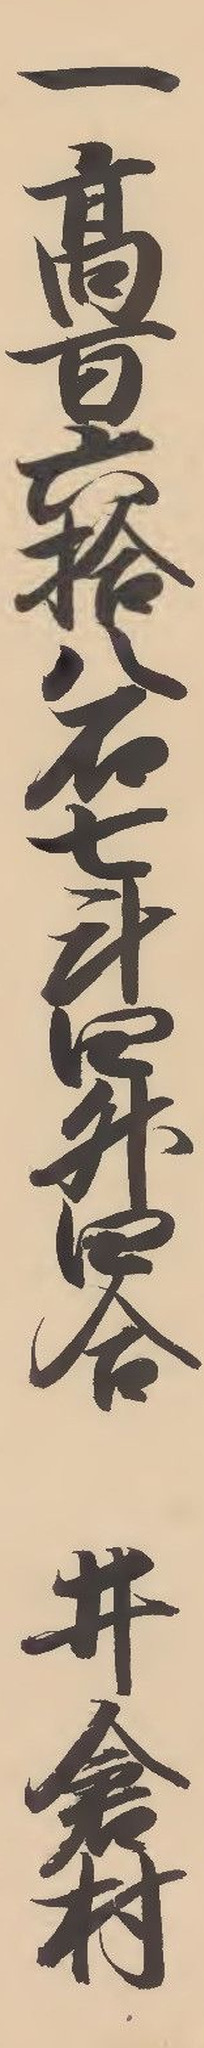一高百六拾八石七斗四升四合井倉村
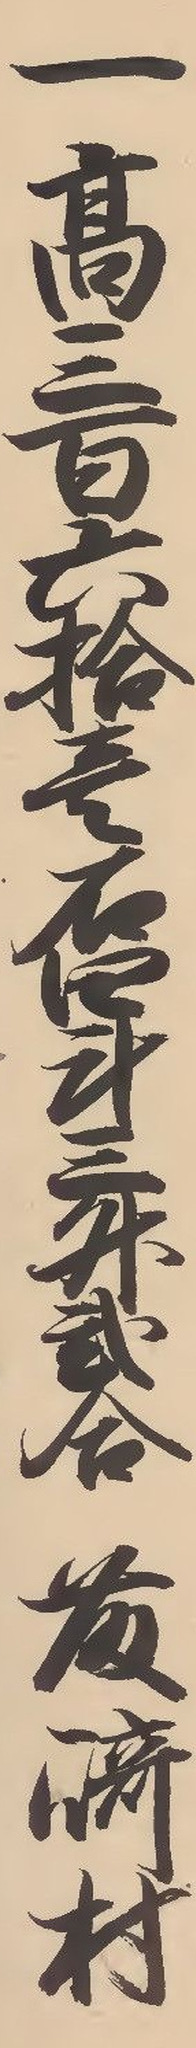一高三百六拾壱石四斗三升弐合藤崎村
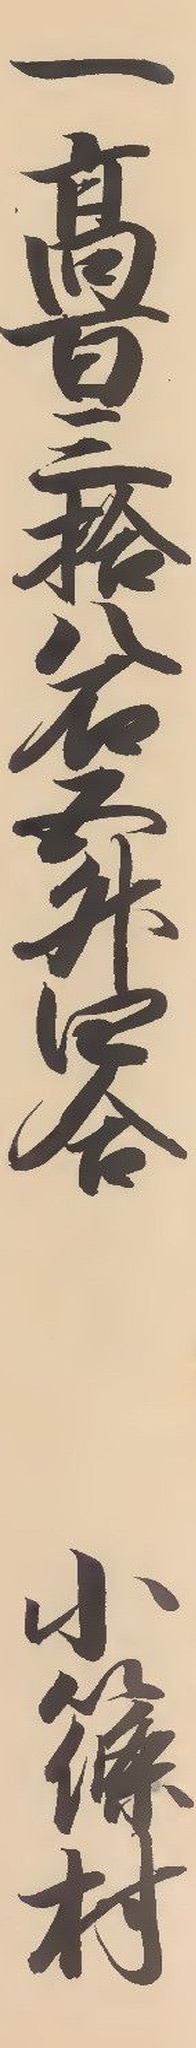一高百三拾八石五升四合小篠村
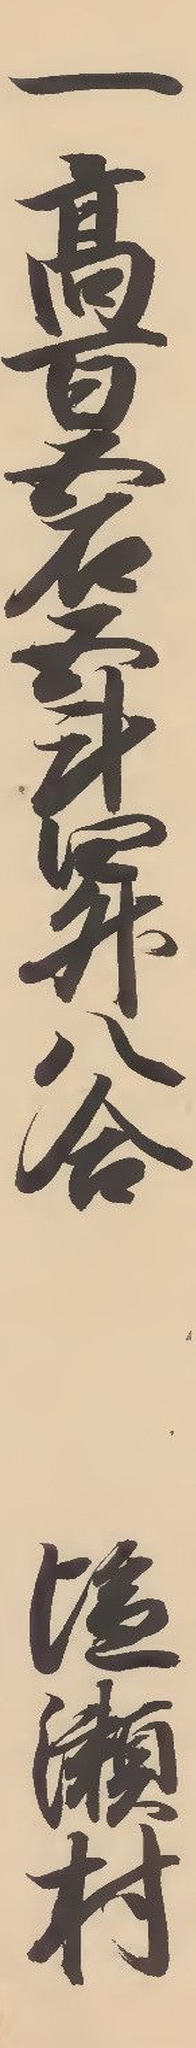一高百五石五斗四升八合塩瀬村
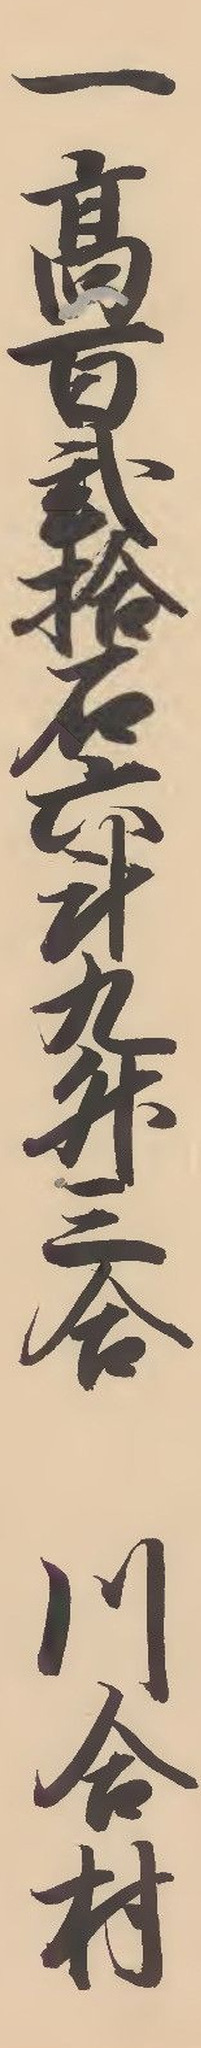一高百弐拾石六斗九升三合川合村

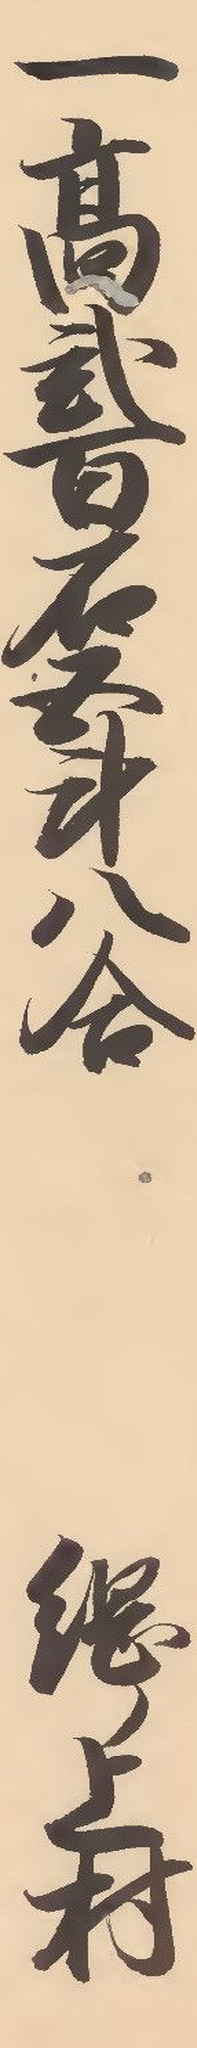一高弐百石五斗八合綱ノ上村
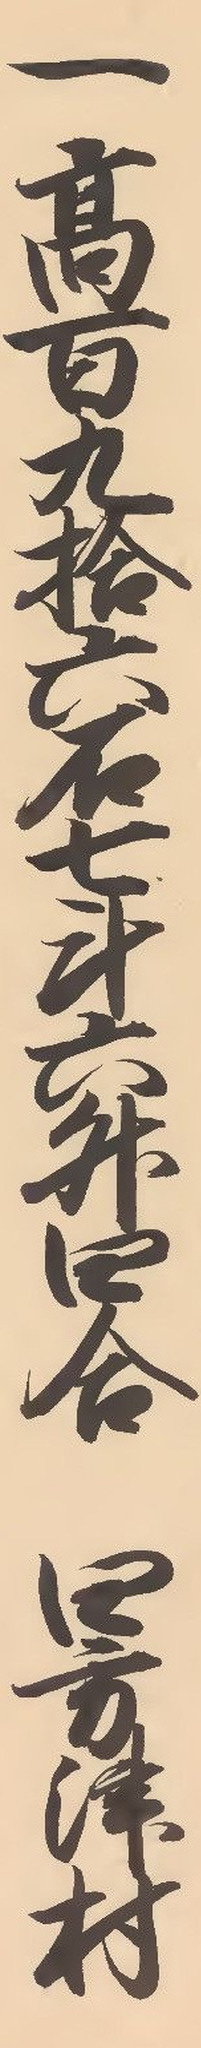一高百九拾六石七斗六升四合四方津村
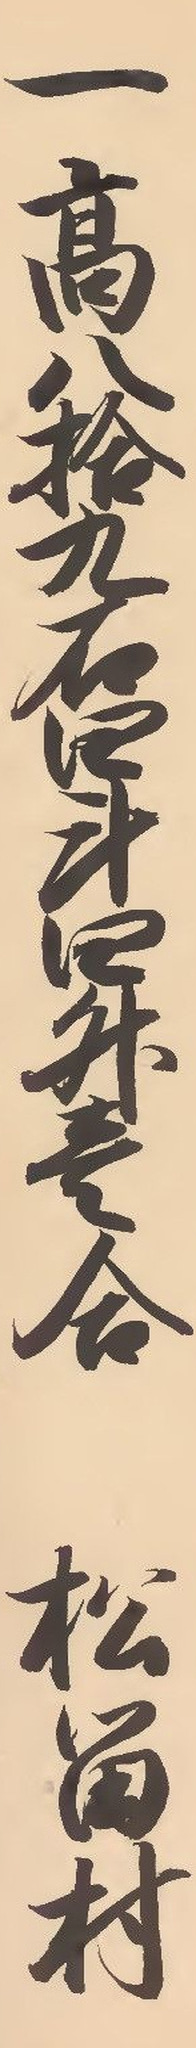一高八拾九右四斗四升壱合松留村
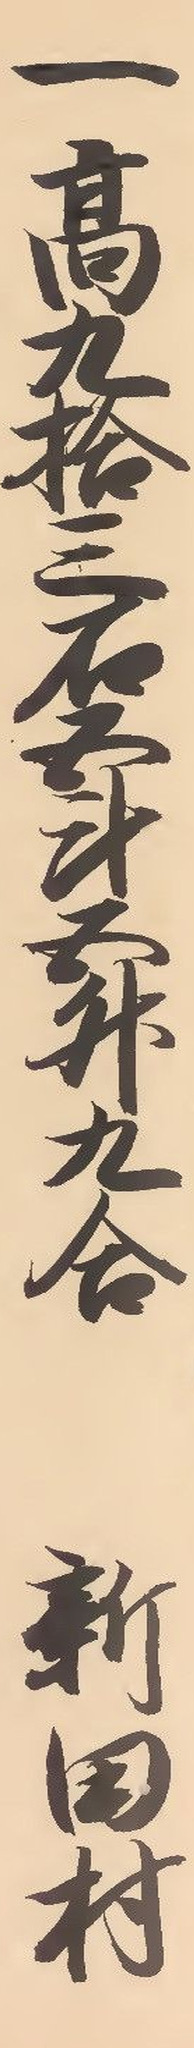一高九拾三石五斗五升九合新田村
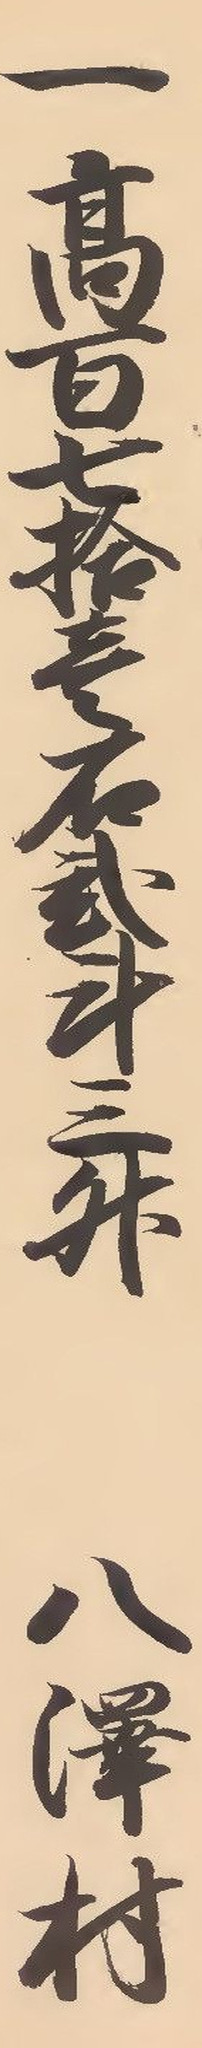一高百七拾壱石弐斗三升八沢村
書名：甲斐国郷帳
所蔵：国立公文書館 National Archives of Japan
